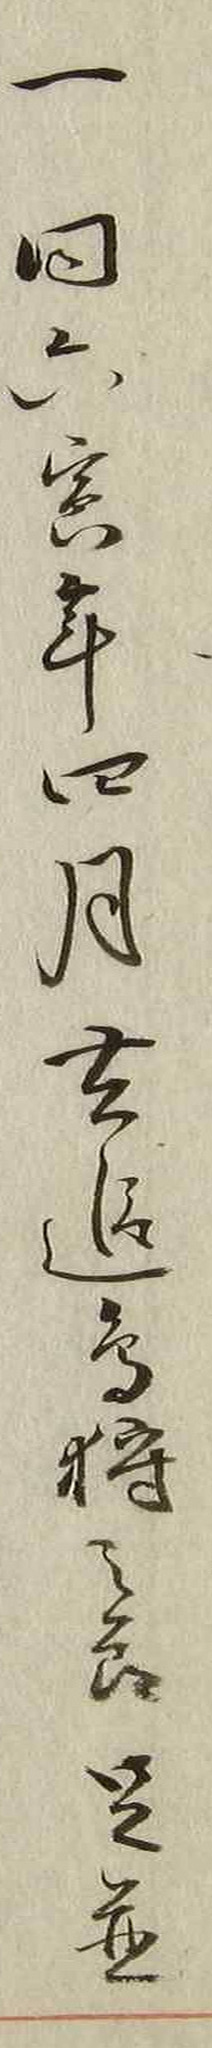一同六寅年四月去追鳥狩之節足並
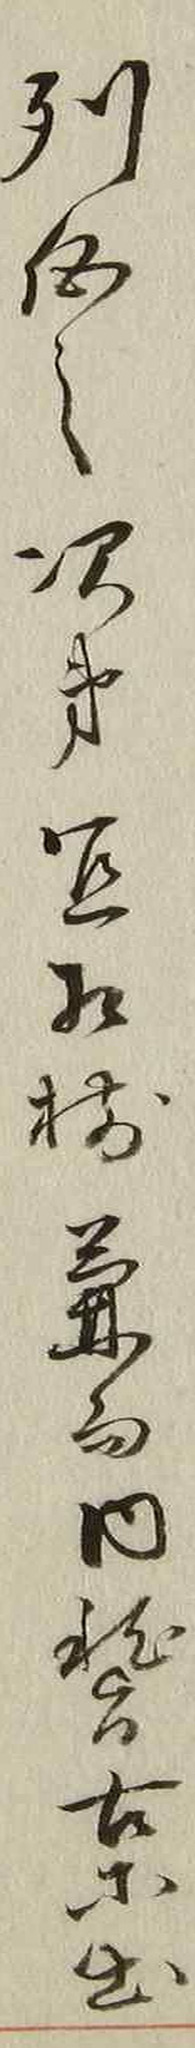列伍之次第宜相揃兼而内稽古等出
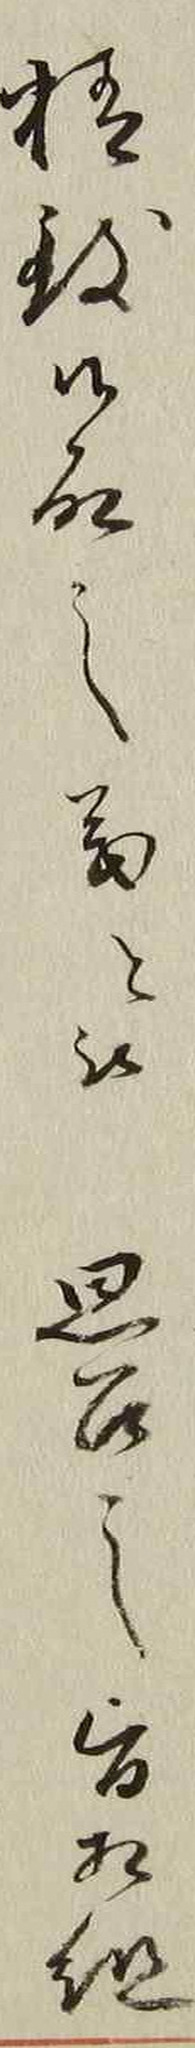精致候故之義と被思召之旨相組
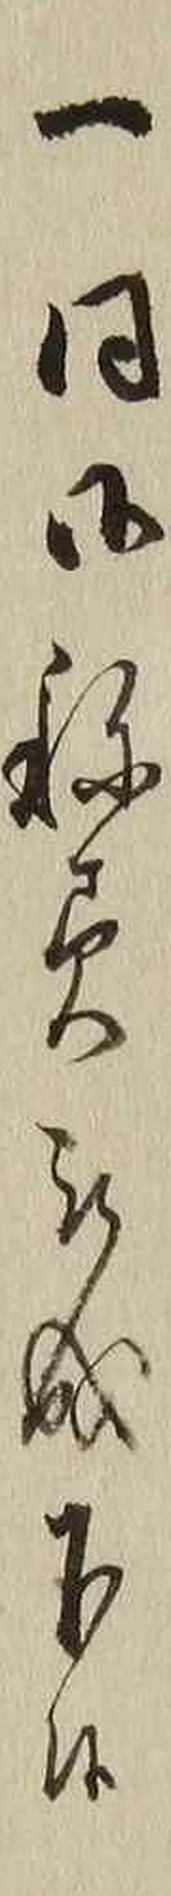一同御称美被成下候
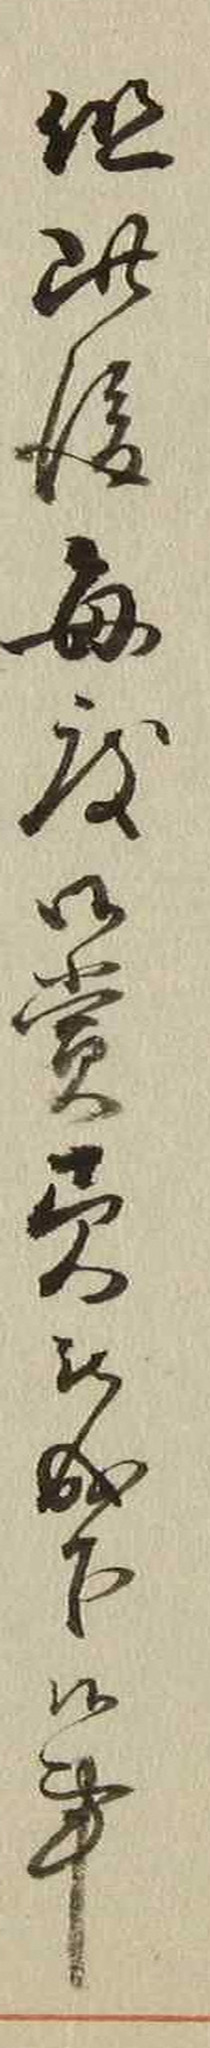但此後毎度御賞美被成下候事
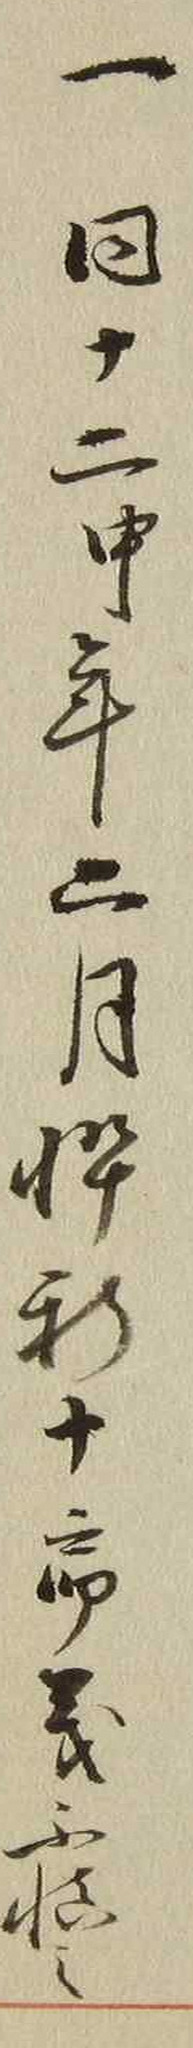一同十二申年二月忰新十郎義不慎之
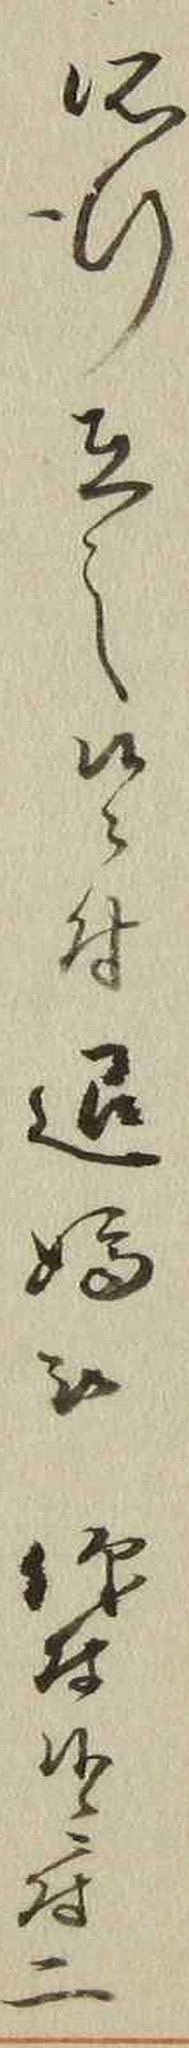所行在之候ニ付退嫡被仰付候ニ付二
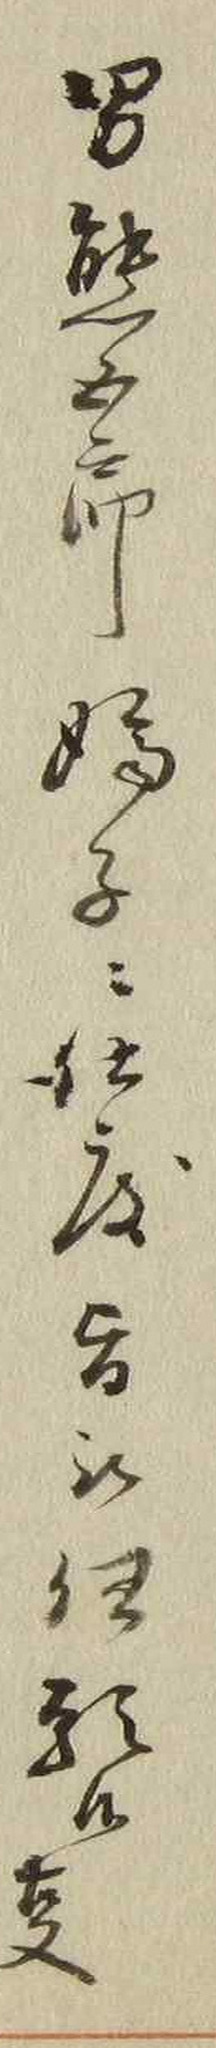男熊五郎嫡子ニ仕度旨被任願候事
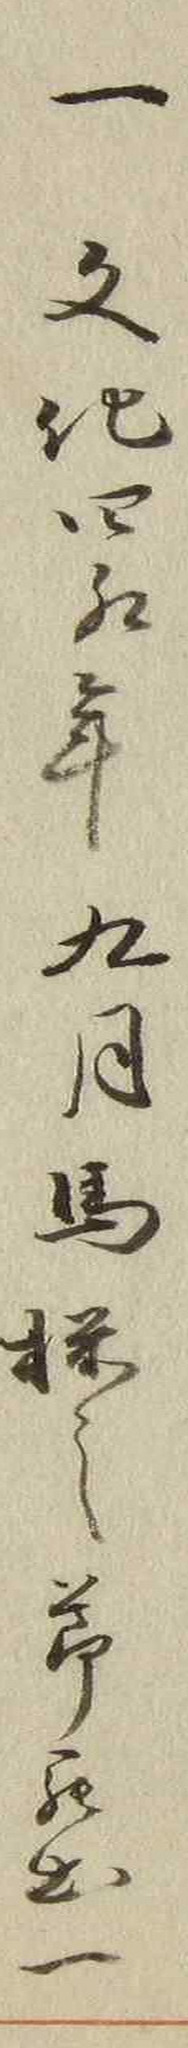一文化四卯年九月馬揃之節罷出一
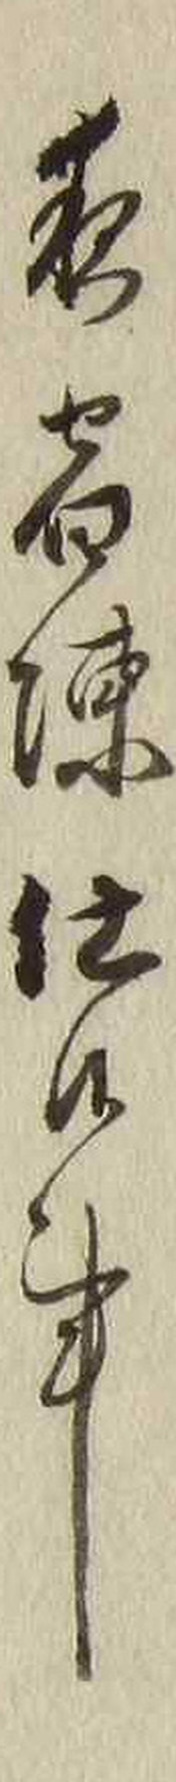夜宿陳仕候事
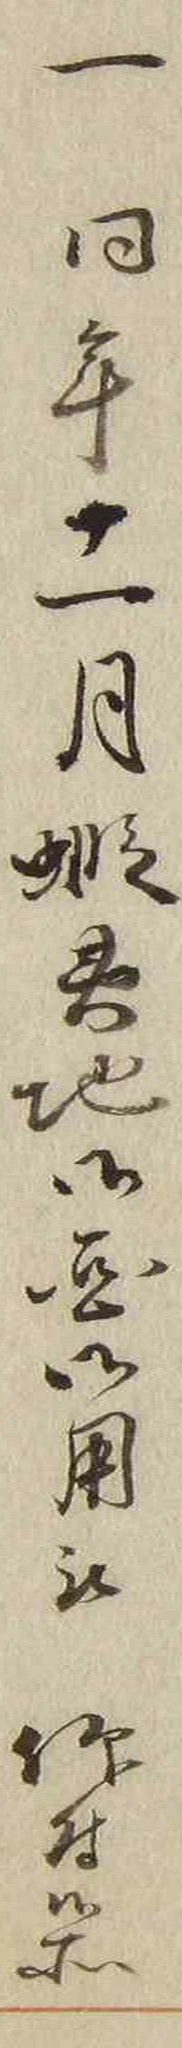一同年十一月蝦夷地御固御用被仰付候所
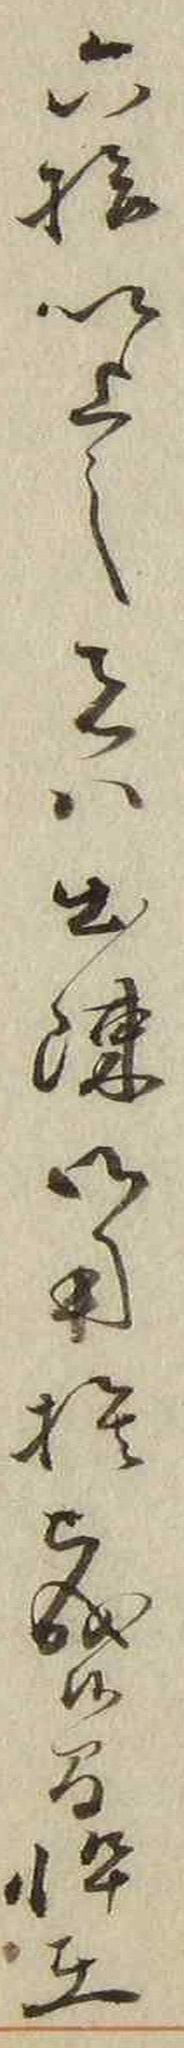六拾以上之者ハ出陳御用捨被成候間忰在
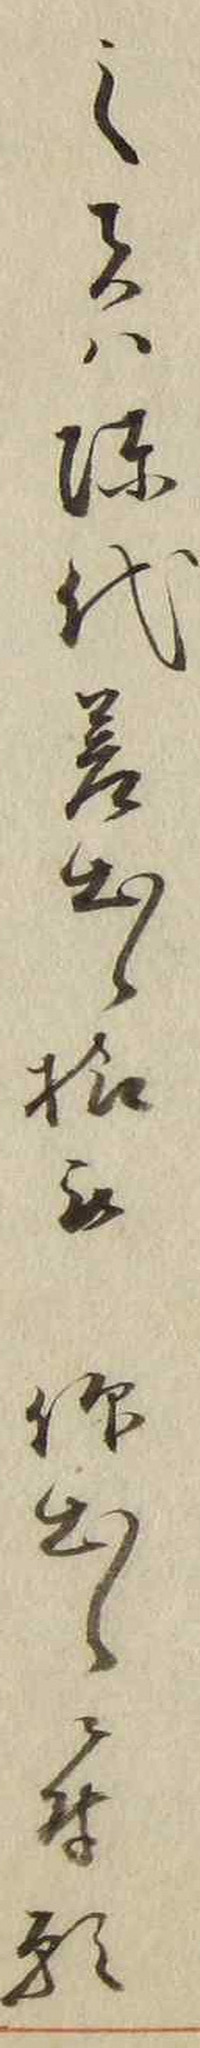之者ハ陳代差出候様被仰出候ニ付願

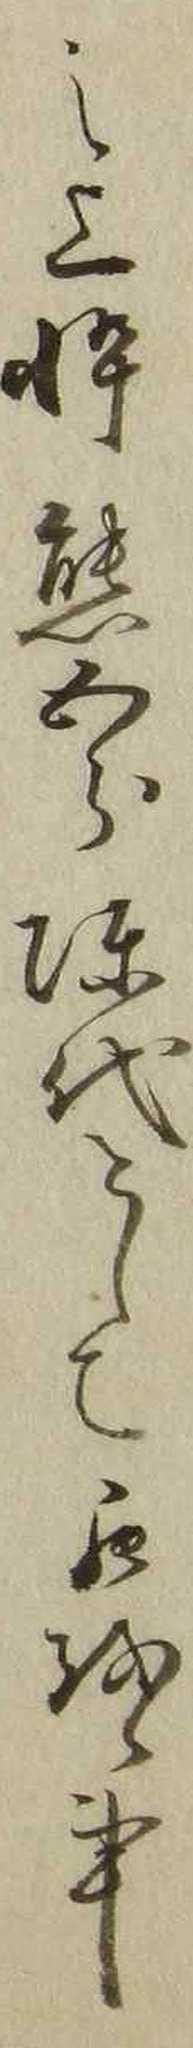之上忰熊五郎陳代として罷越候事
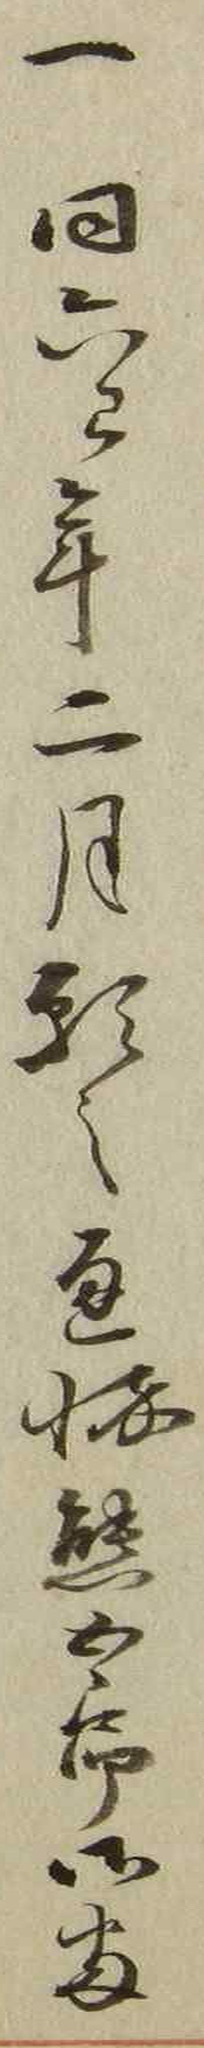一同六巳年二月願之通忰熊五郎御番
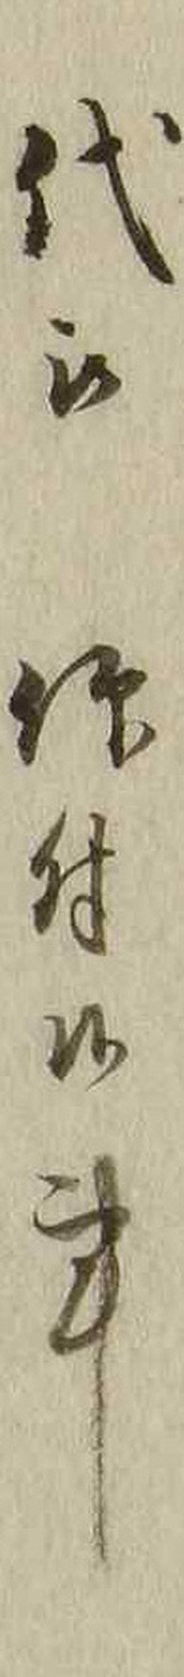代被仰付候事
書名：諸士系譜　巻之26　い之部26
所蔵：会津若松市立会津図書館
